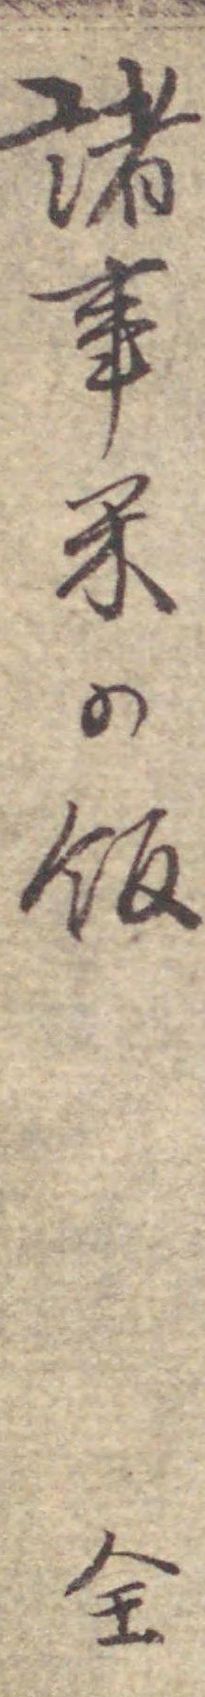諸事米の飯全

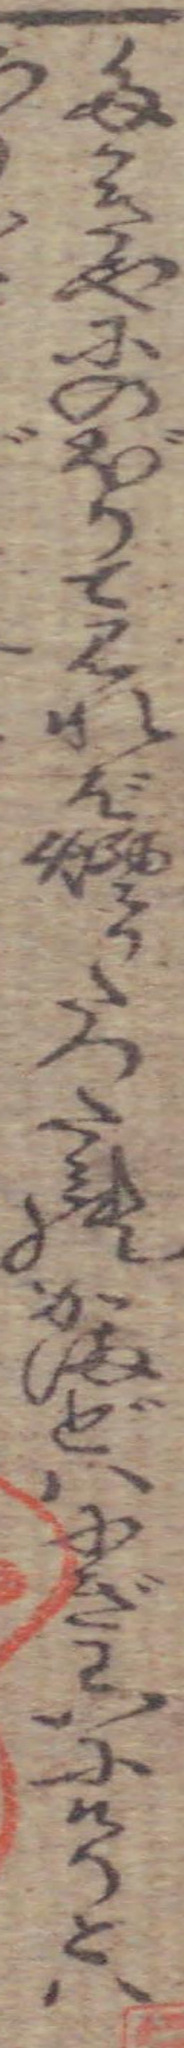たかきやにのぼりて見れば煙りたつたみのかまどはにぎわいにけりとは
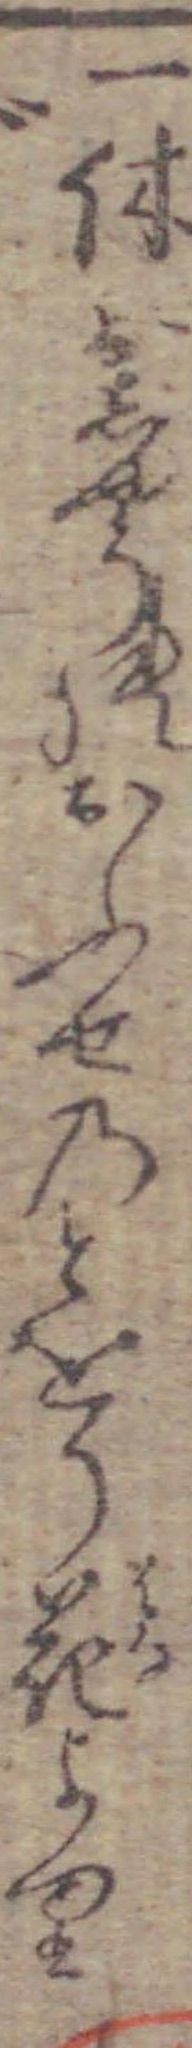一休おしやうのおふせのとをり花よりは
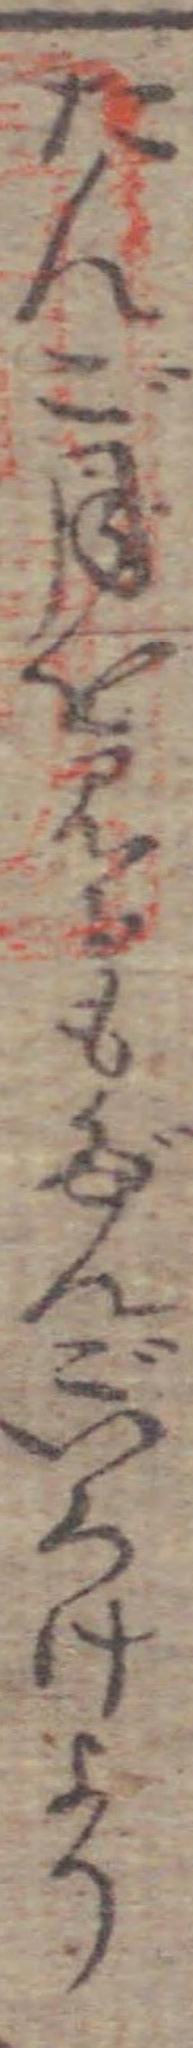だんご月を見るもだんごいろけより
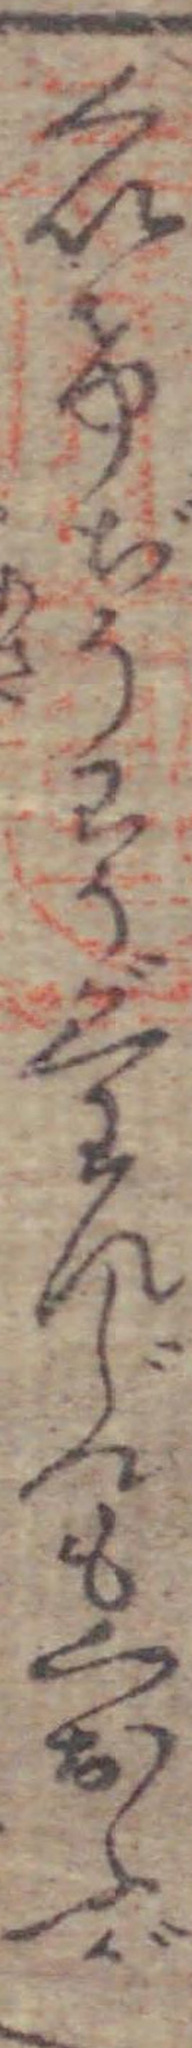くいけぢうわりがくわんじんもくおふが
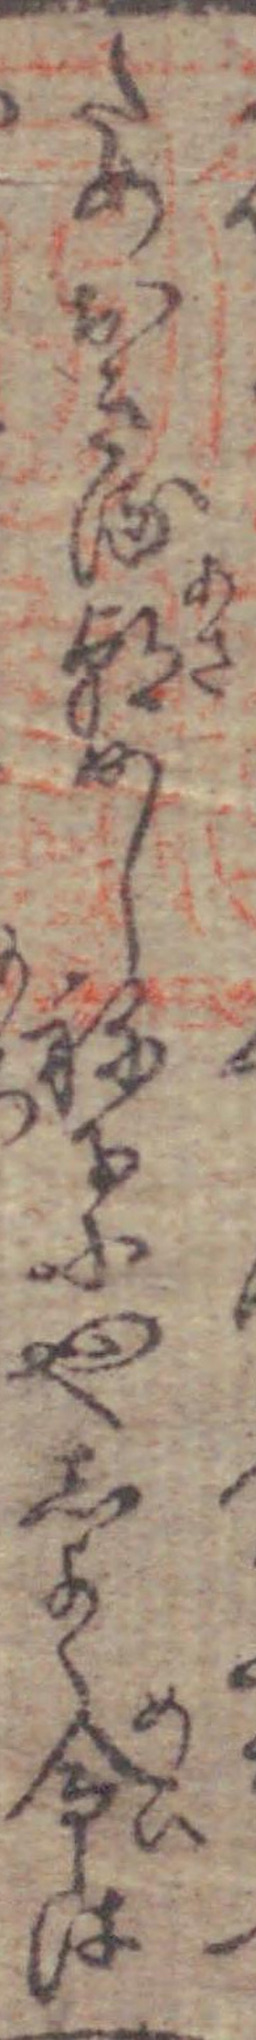ためおきる朝めしねるにやしよく命は
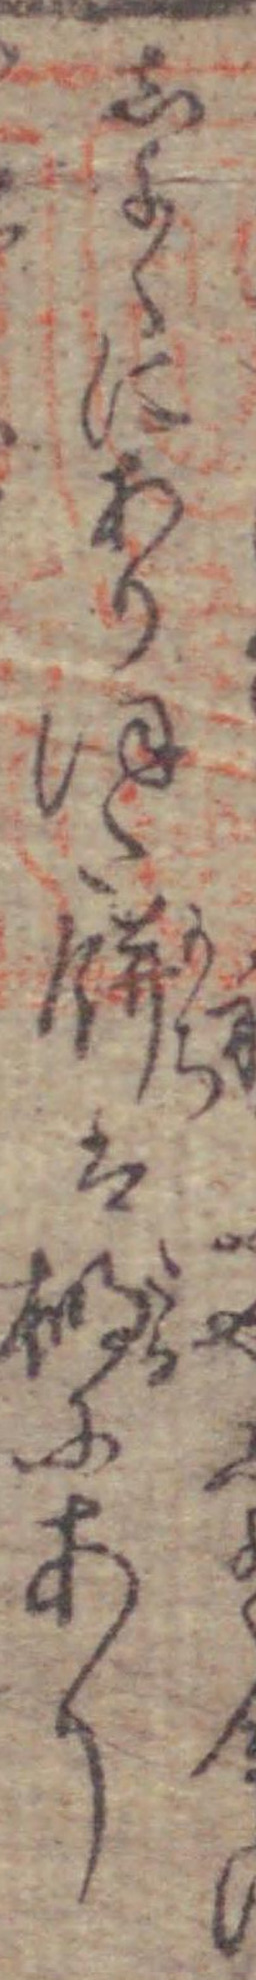しょくにありほた餅は棚にあり
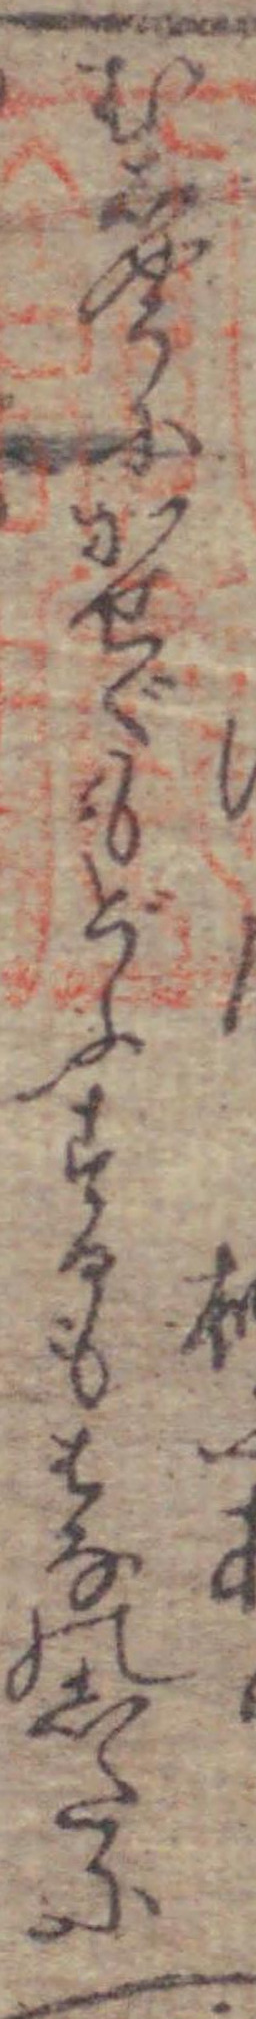むしやうにかせぐもどふするもはなのしたに
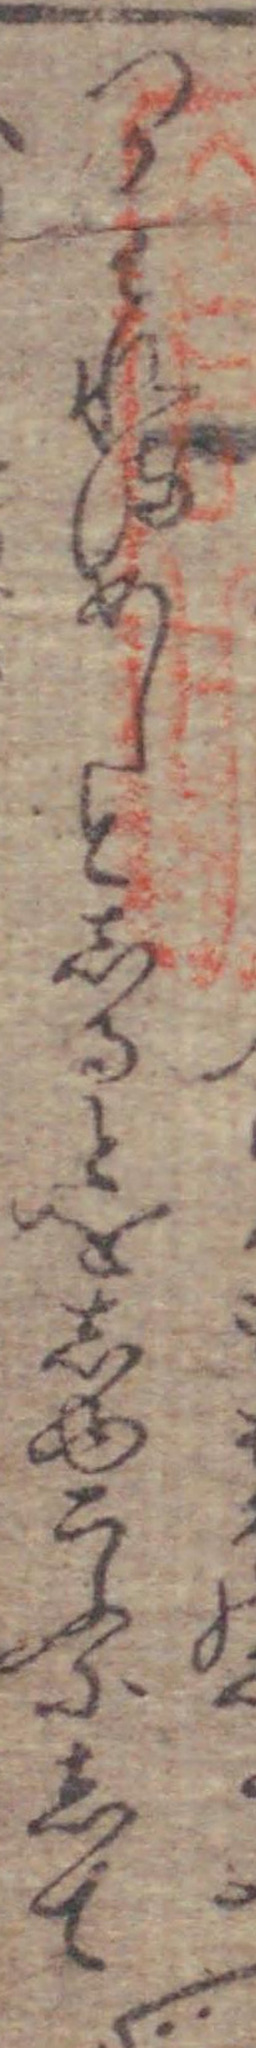つかわれるめしとしるとをしゆこふにして
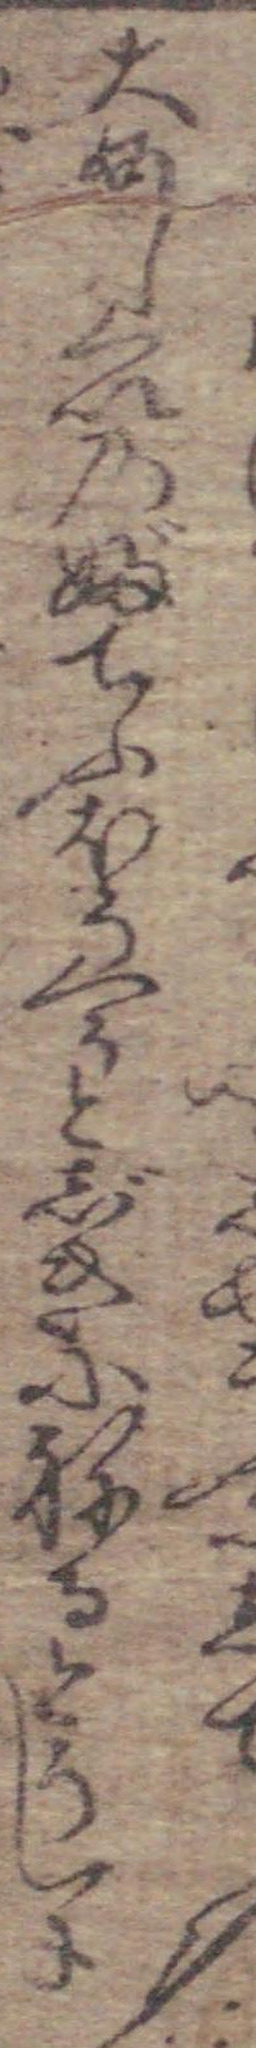大めしくいのぶてふほうくうとじきにねるとうしに
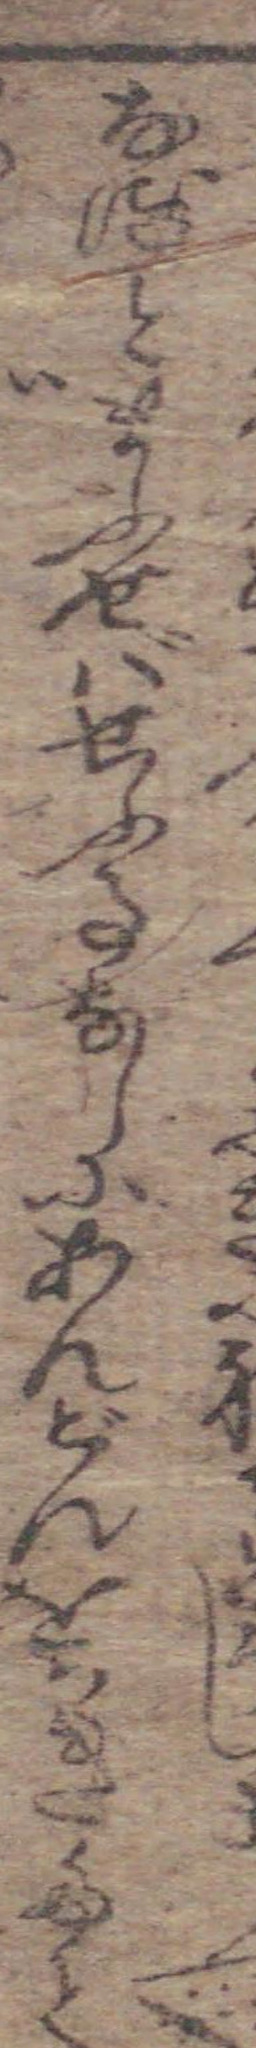なるとまふせばせふ事なしにあんどんをかきたてはんぶん
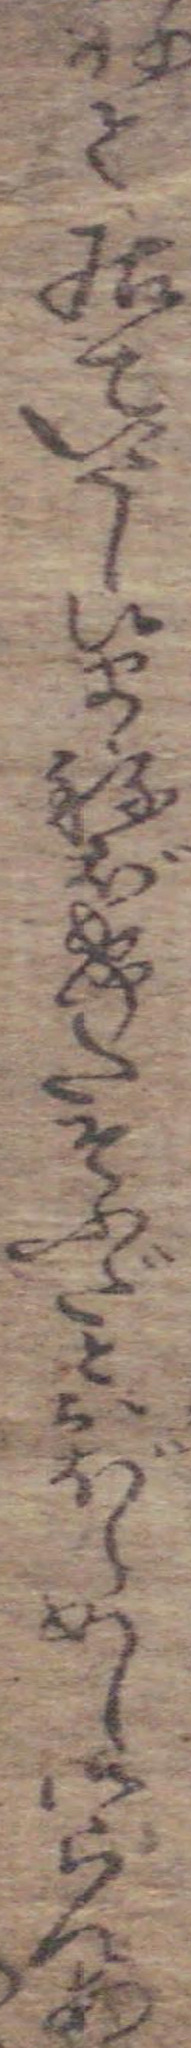ねて居ていたし候まゝねぼけたそふだとおぼしめし御らんあそはし

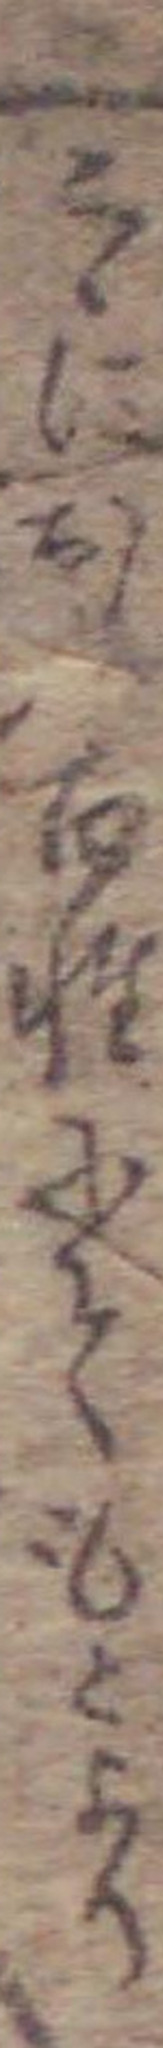ここにお百性にてもとより
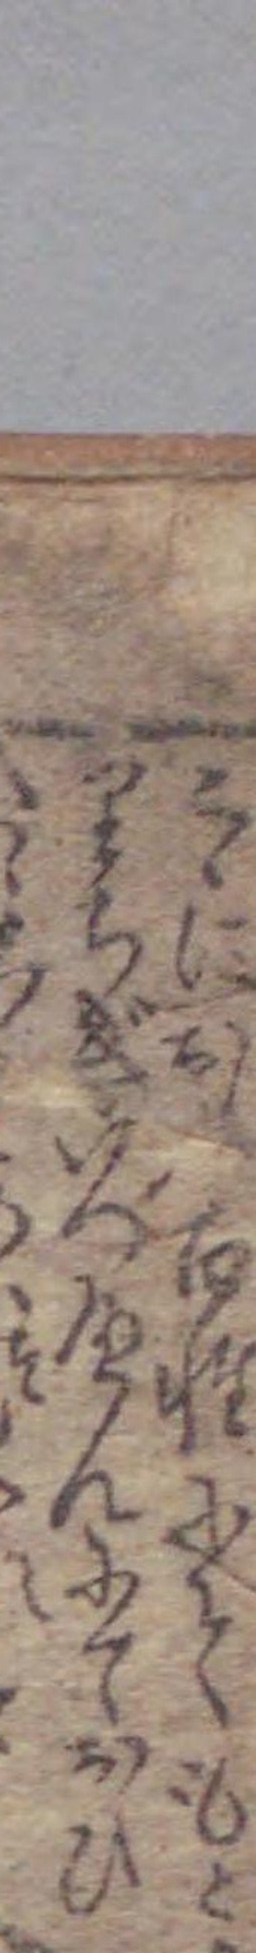りちぎいつへんにておひ
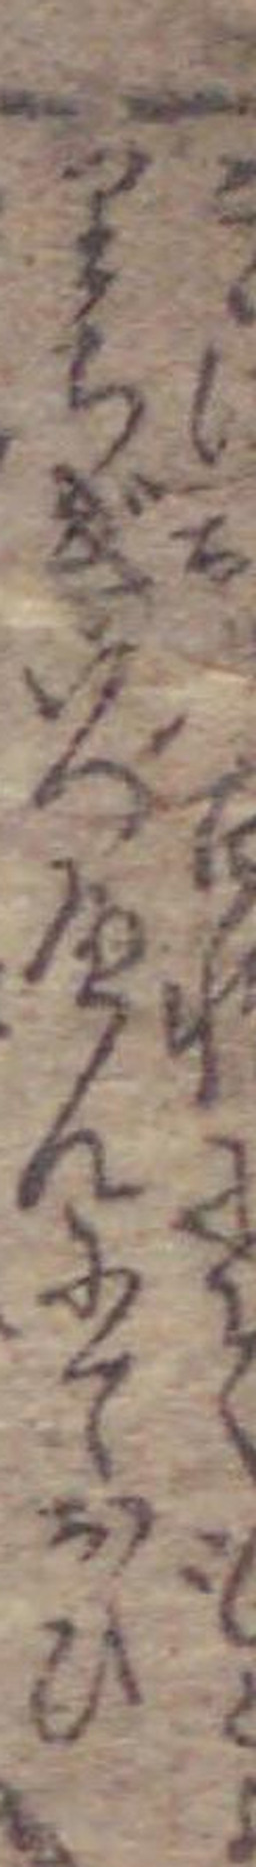りちぎいつへんにておひ
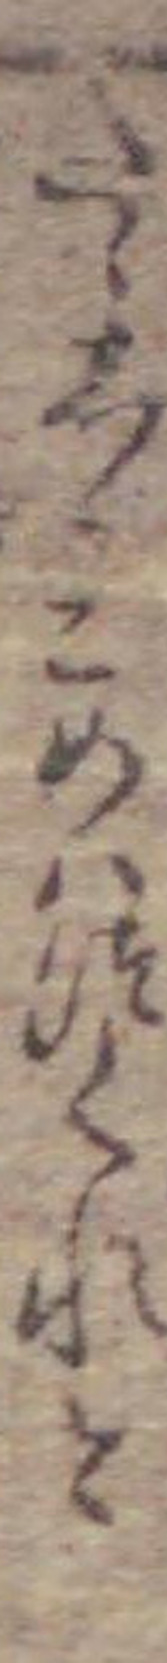たゝしくこめはつくれと
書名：諸事米の飯 : 3巻
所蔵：国立国会図書館 National Diet Library, JAPAN
